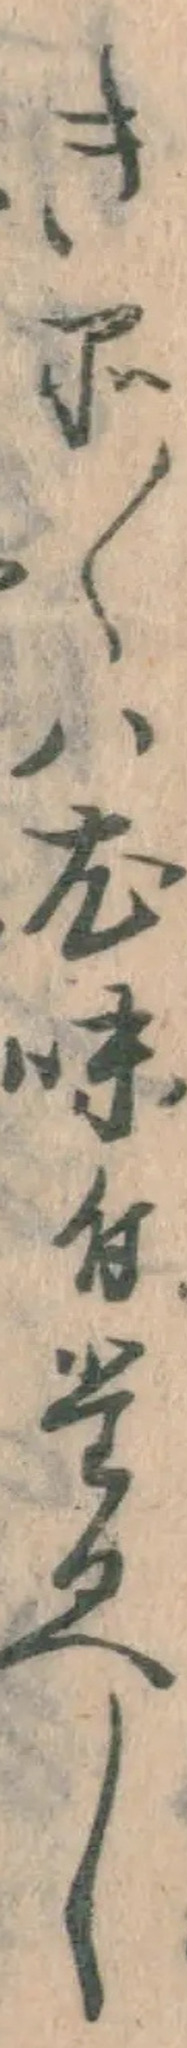き品〳〵は尤味付たるへし
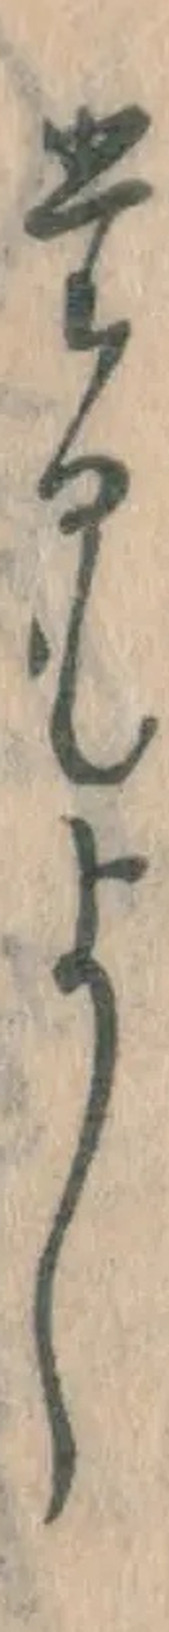たるもよし
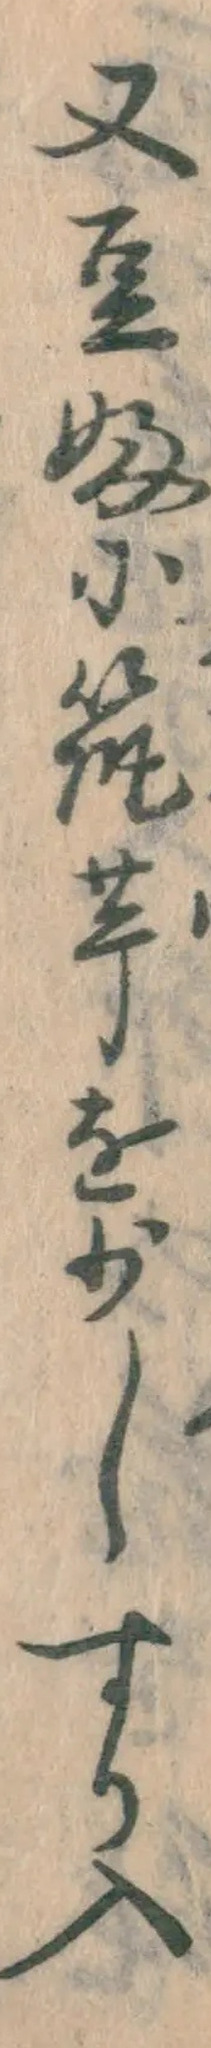又豆ふに筑芋を少しすり入
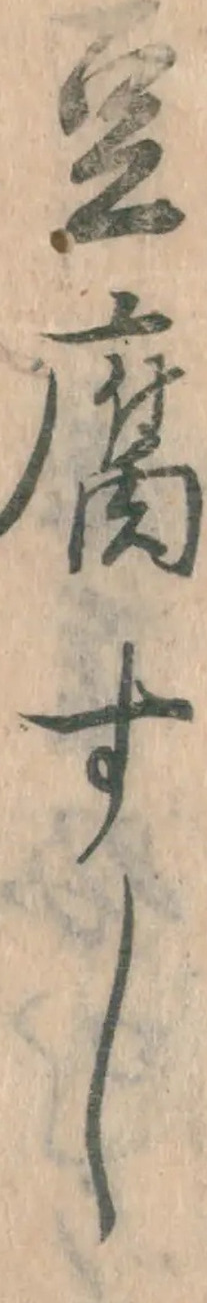豆腐すし
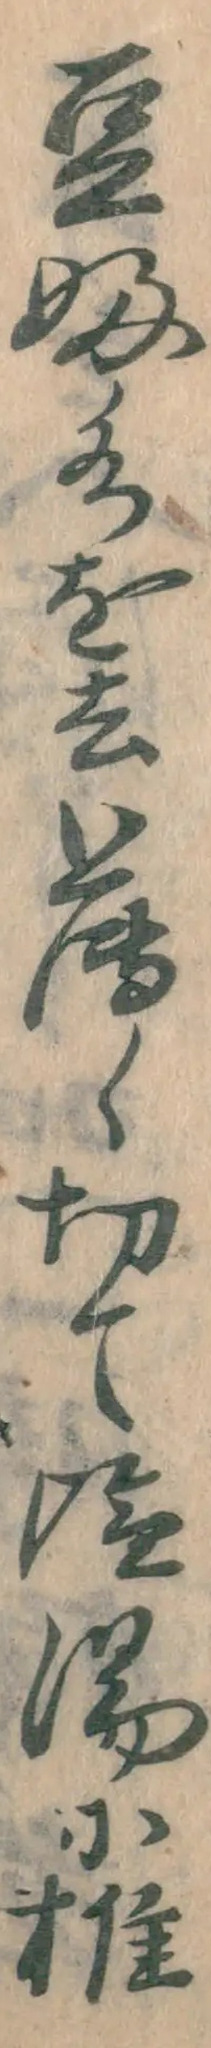豆ふ水を去薄く切て塩湯に椎

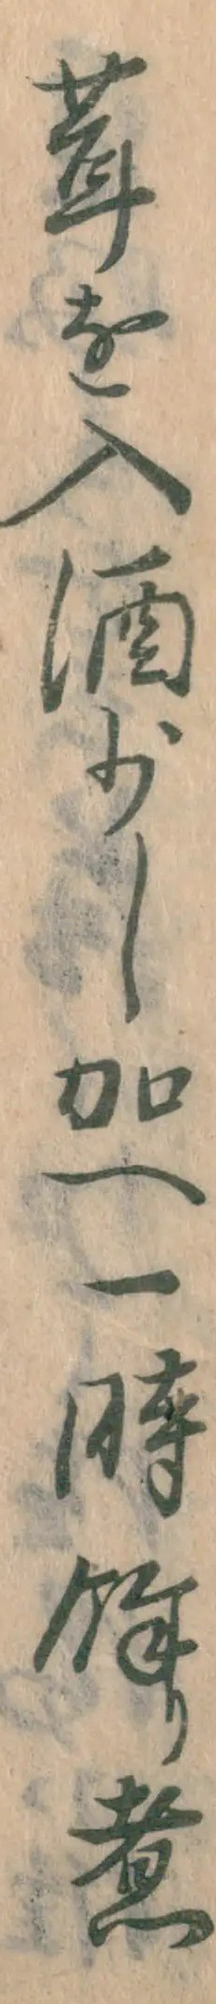茸を入酒少し加へ一時余り煮
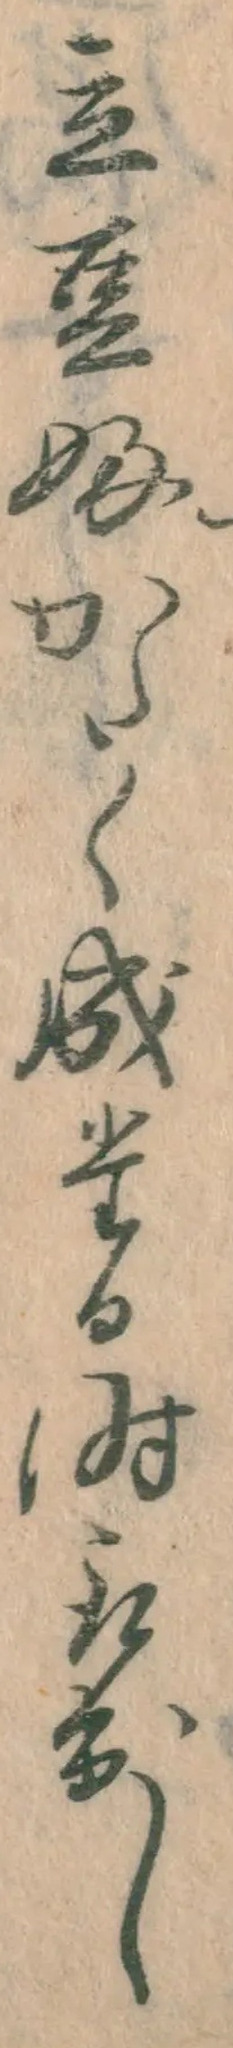立豆ふかたく成たる時取出し
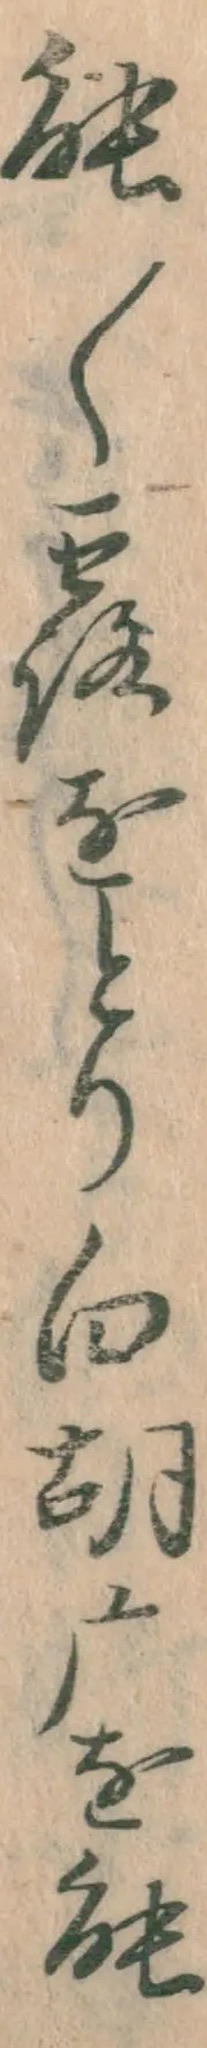能〳〵露をとり白胡麻を能
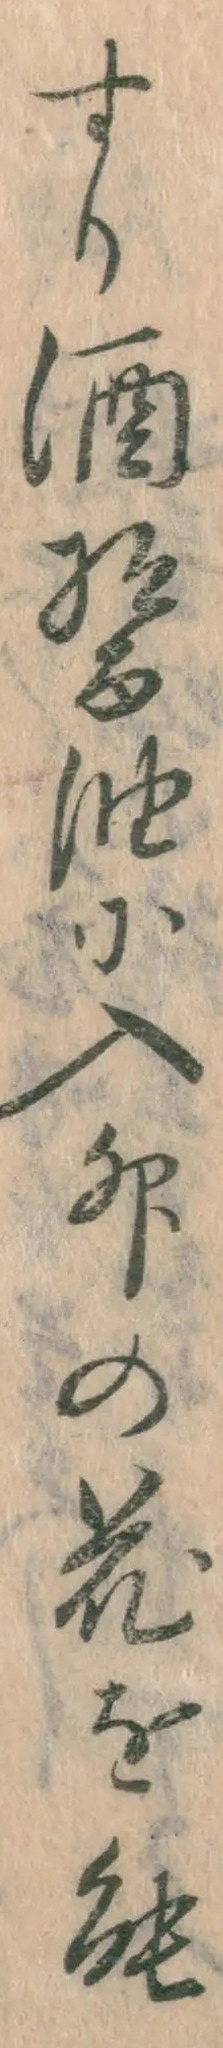すり酒醤油に入卯の花を能
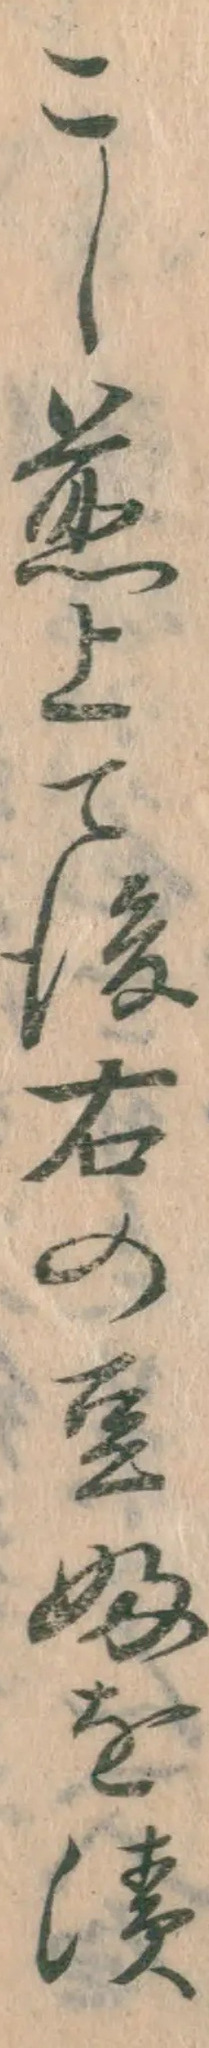こし煎上て後右の豆ふを漬
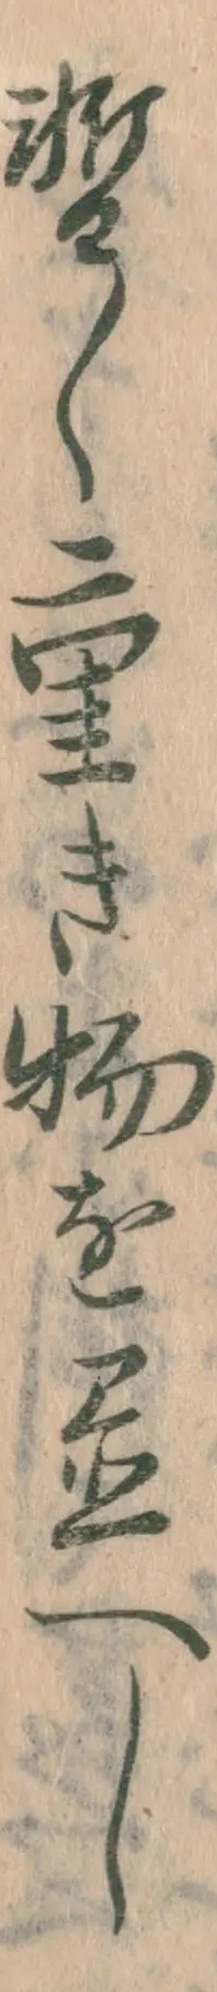暫く重き物を置へし
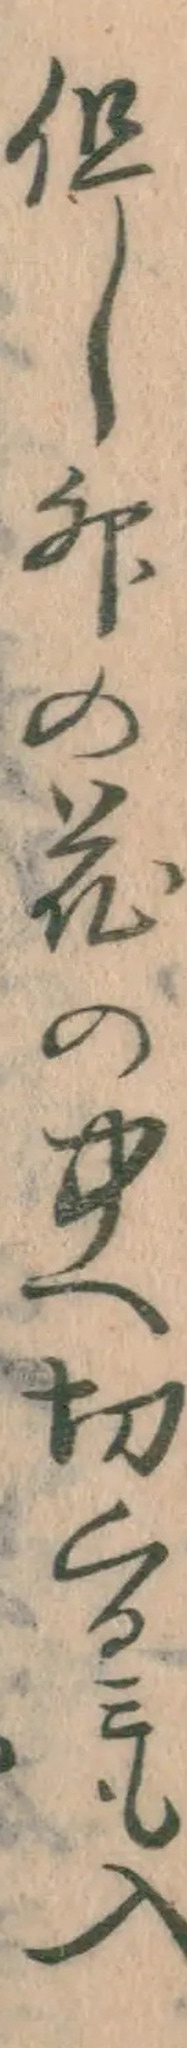但し卯の花の中へ切くるみも入
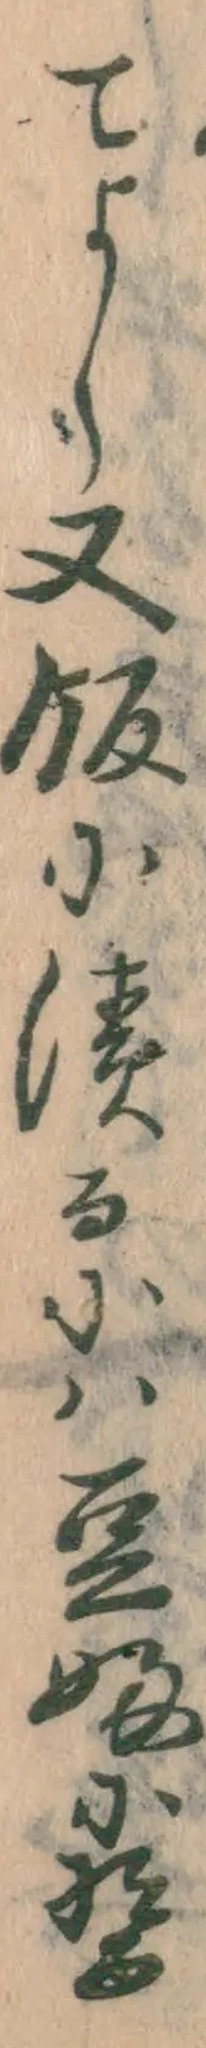てよし又飯に漬るには豆ふに醤
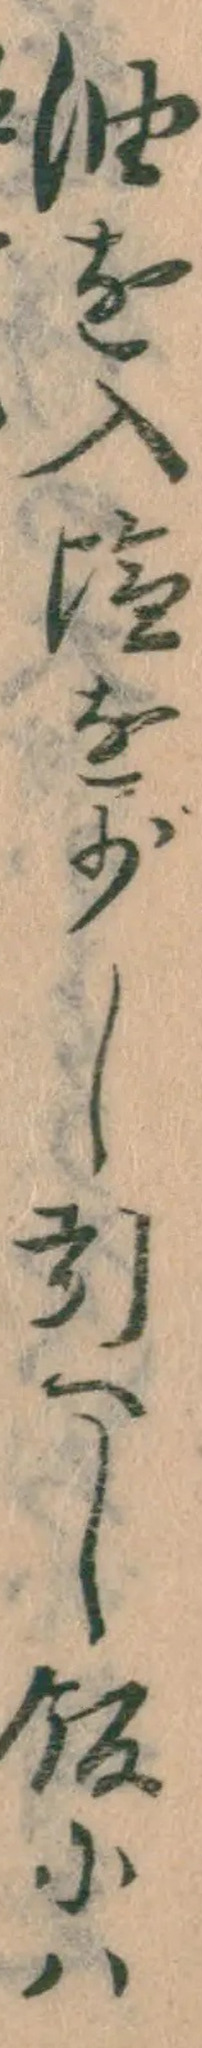油を入塩を少し引へし飯には
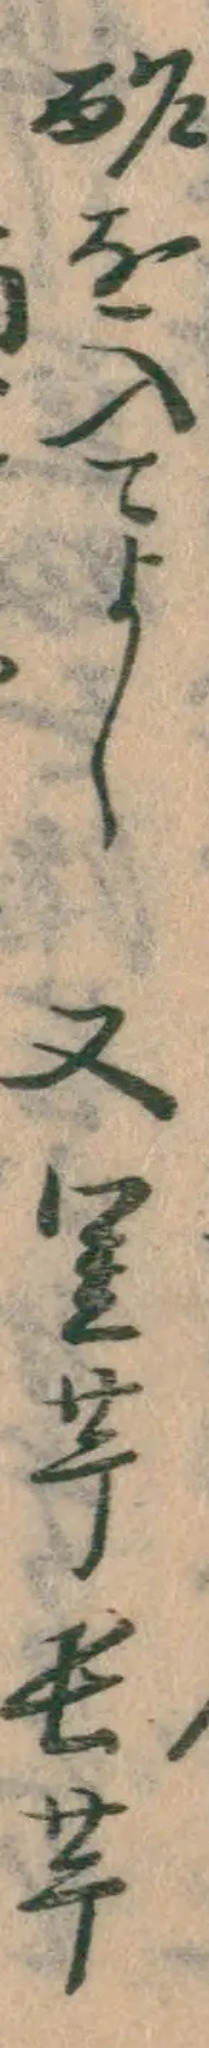酢を入てよし又里芋長芋
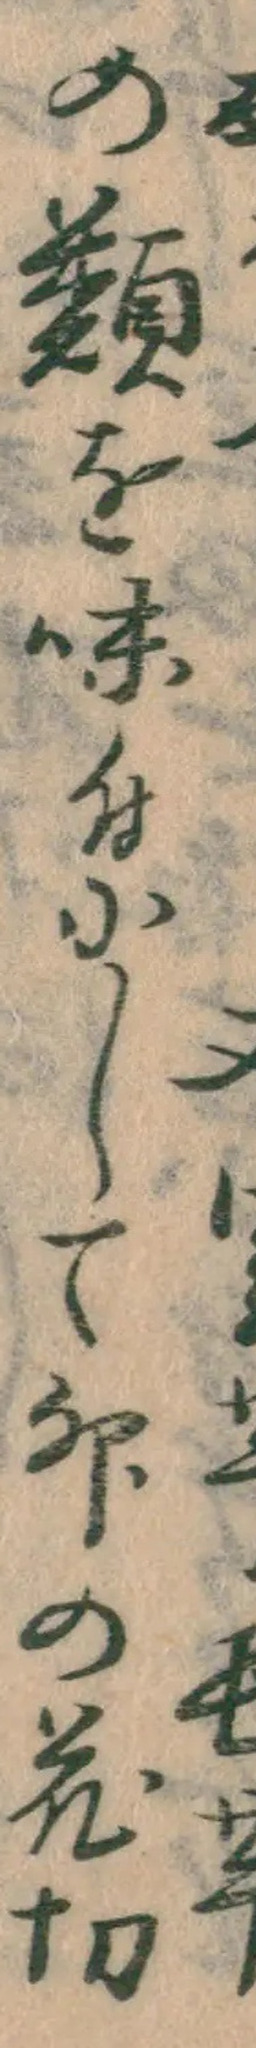の類を味付にして卯の花切
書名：豆腐百珍余録
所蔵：国立国会図書館 National Diet Library, JAPAN
